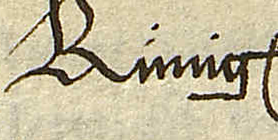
Künig*
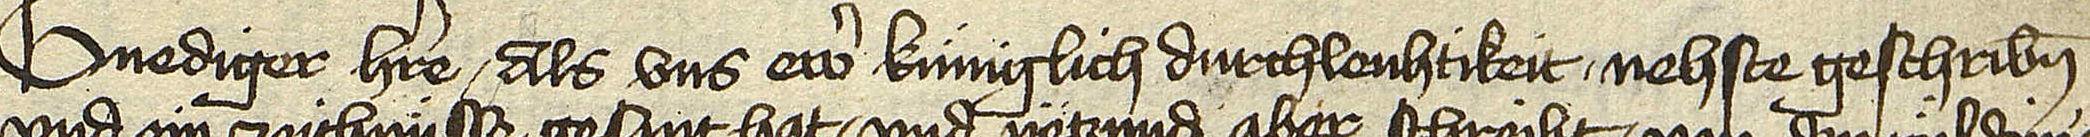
Gnediger h*re / Als vns ew* küniglich durchleuhtikeit / nehſte geſchribn*
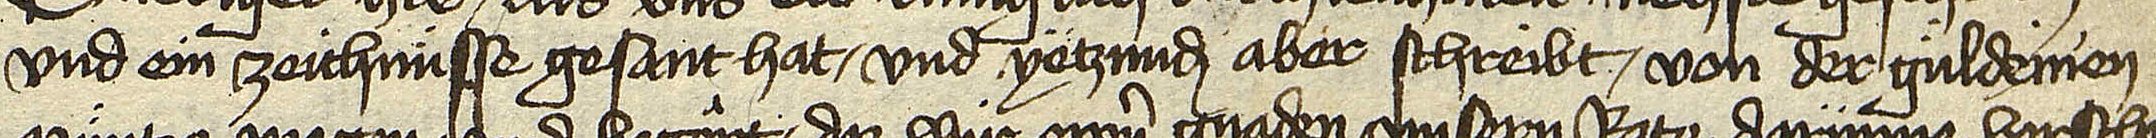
vnd ein cʒeichnüſſe geſant hat / vnd yetʒund* aber ſchreibt / von der güldeinen
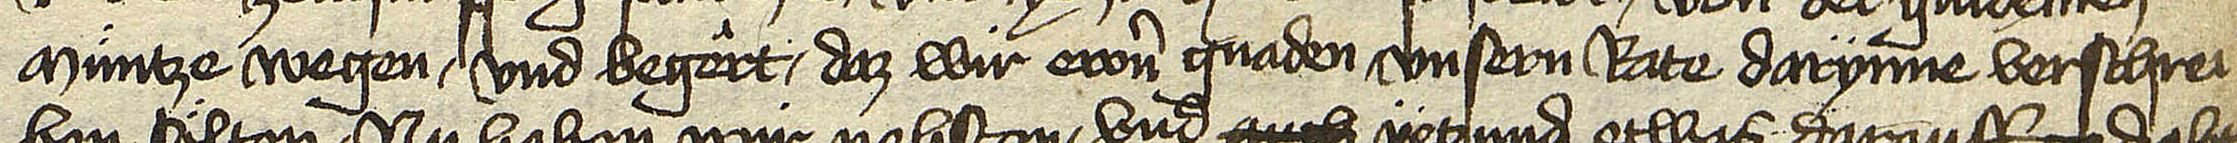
Müntʒe wegen / vnd begërt / daʒ wir ewn* gnaden / vnſern Rate darynne verſchrei
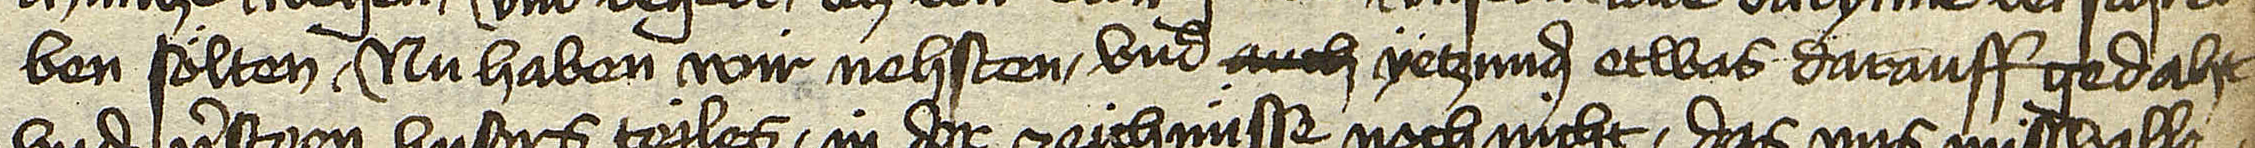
ben ſölten / Nu haben wir nehſten / vnd auch yetʒund* etwas darauff gedaht
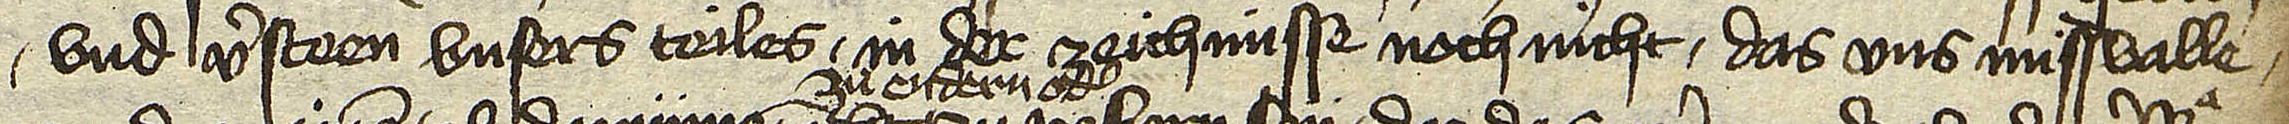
/ vnd v*ſteen vnſers teiles / in der cʒeichnüſſe noch nicht / das vns miſſvalle /
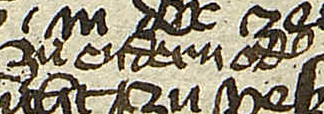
ʒu endern od*
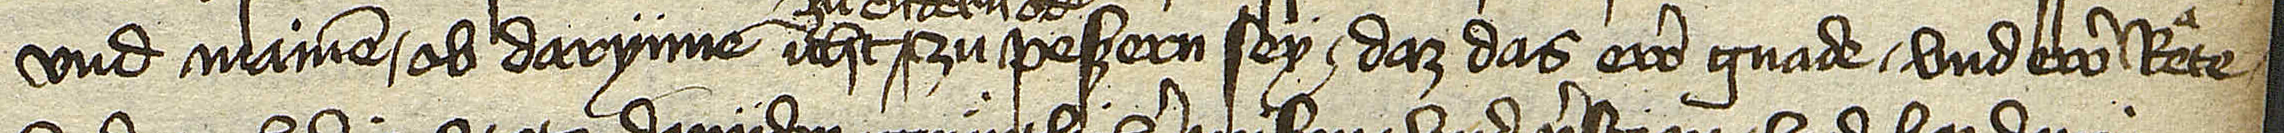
vnd maine* / ob darynne icht cʒu peſʒern ſey / daʒ das ew* gnade / vnd ew* Rëte /
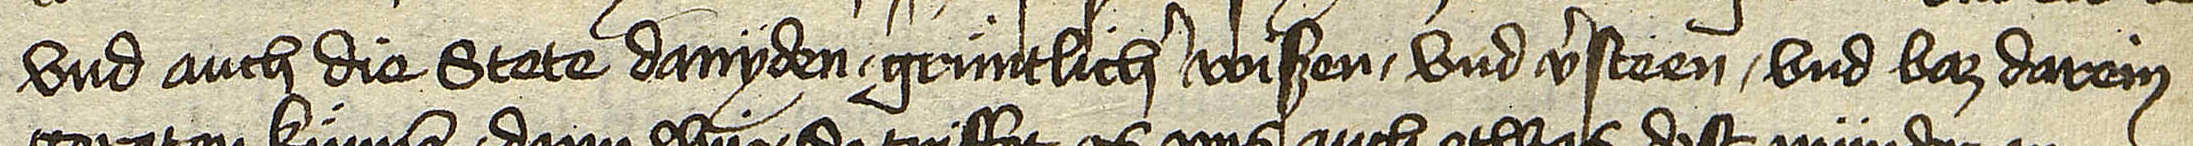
vnd auch die Stete danyden / grüntlich* wiſʒen / vnd v*ſteen / vnd baʒ darein
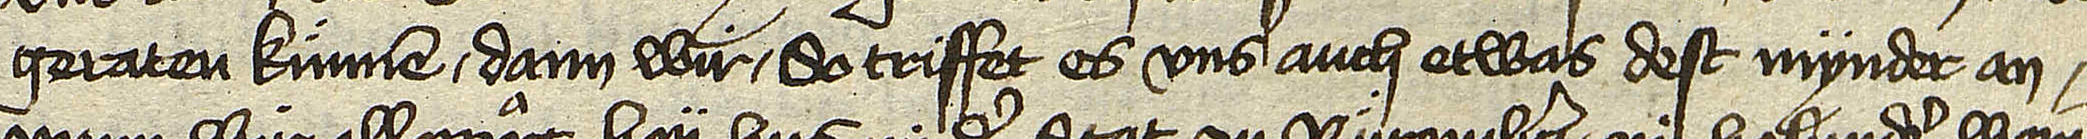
geraten künne* / dann wir / So triffet es vns auch etwas deſt mynder an /
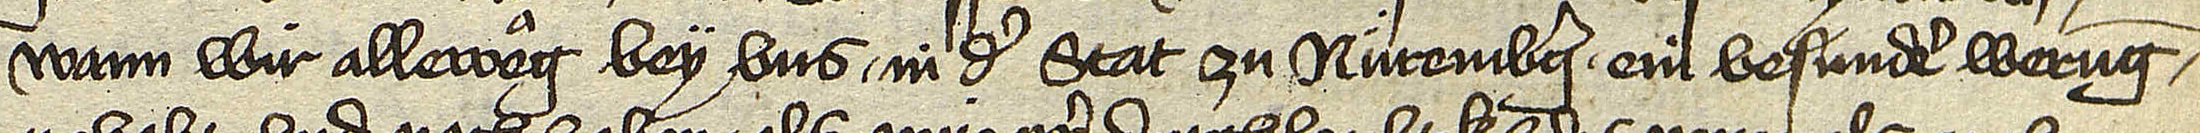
wann wir allewëg bey vns / in d* Stat cʒu Nüremb*g / ein beſunde* werug* /
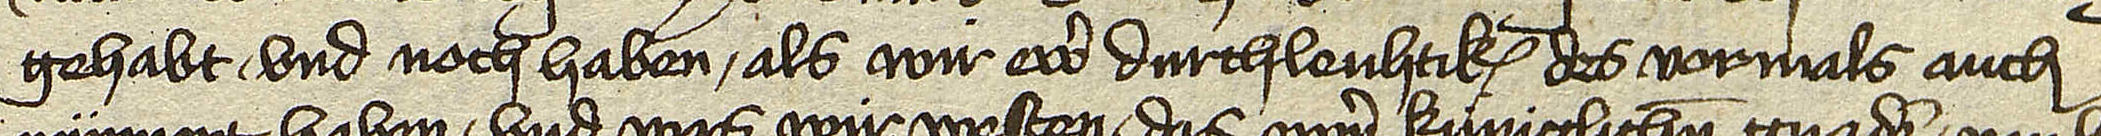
gehabt / vnd noch haben / als wir ew* durchleuhtik* des vormals auch
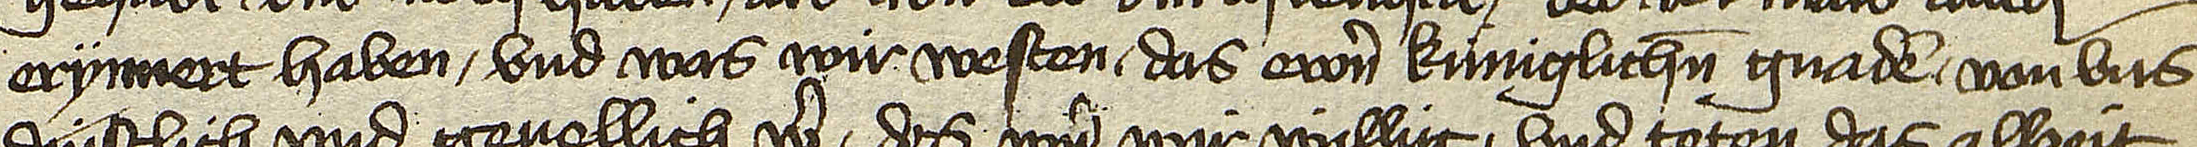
erynnert haben / vnd was wir weſten / das ewn* küniglichn* gnade* / von vns
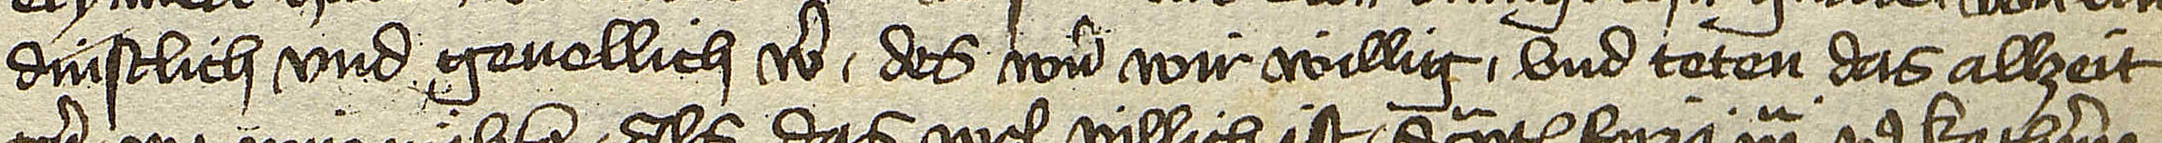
dinſtlich vnd geuellich w* / des wn* wir willig / vnd teten das allʒeit
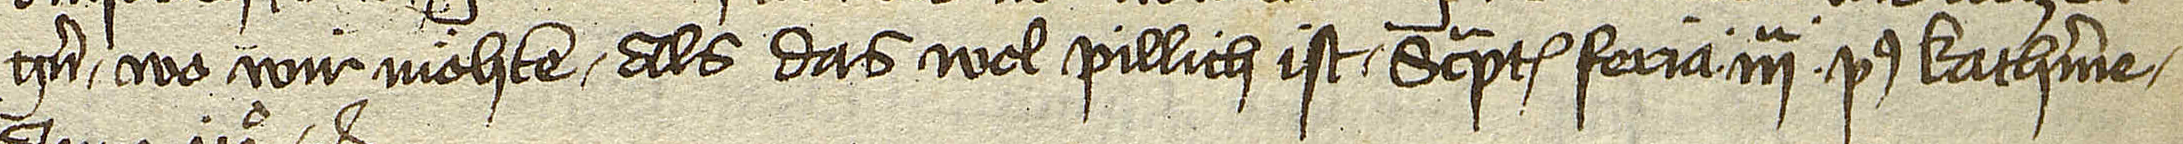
gn* / wo wir möhte* / Als das wol pillich iſt / Sc*pt* feria . iii* . p* Kathine* /
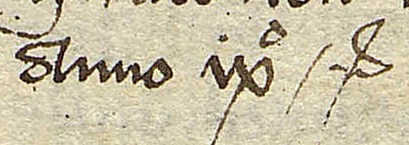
Anno ix* / §
